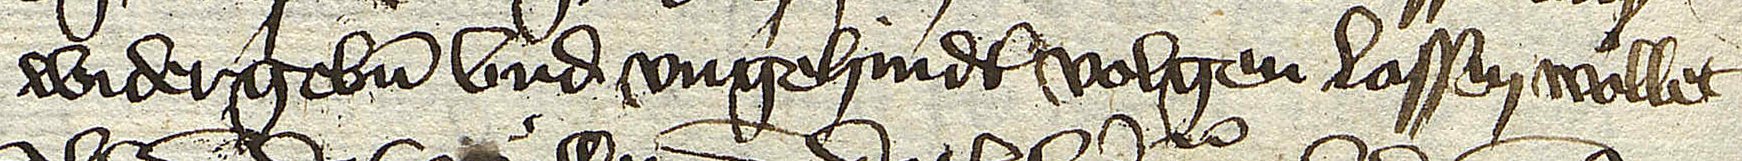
widergeb*n vnd vngehindt* volgen laſſen wöllet
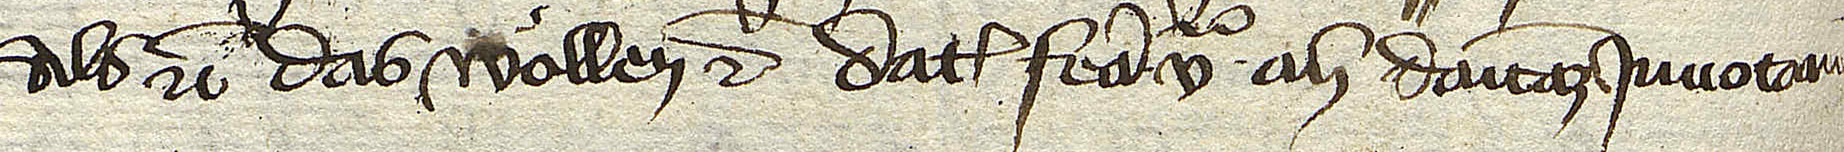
Als ec* das wöllen ec* Dat* fe*a v* . an* doica* Inuocauit
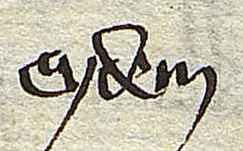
eydem
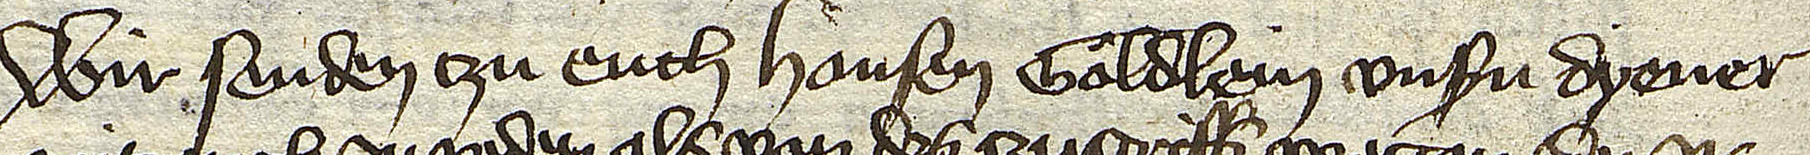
Wir ſenden cʒu euch Hanſen Göldlein vnſ*n dyener
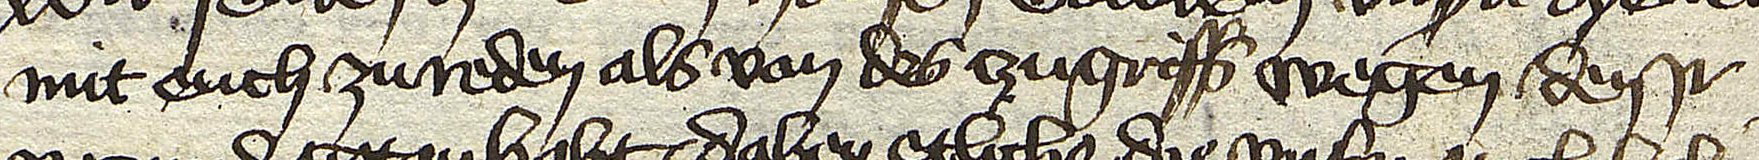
mit euch ʒu reden als von des cʒugriffs wegen / den Ir
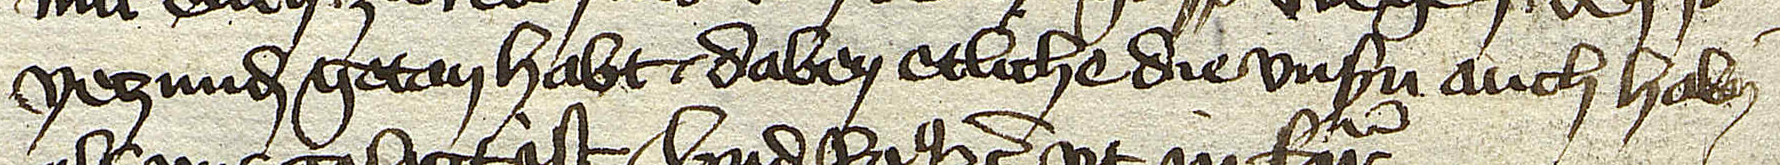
yecʒund* getan habt / dabey etliche die vnſ*n auch hab*n
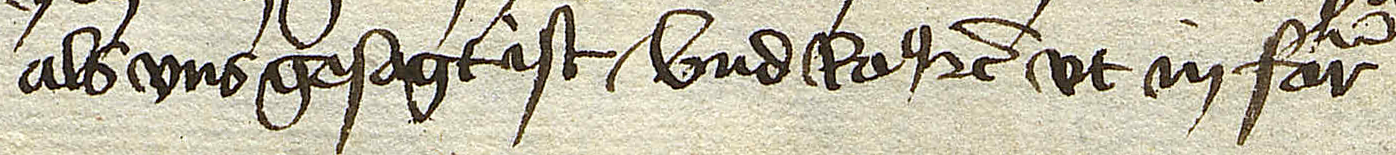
als vns geſagt iſt / Vnd Ro* vt in for*
